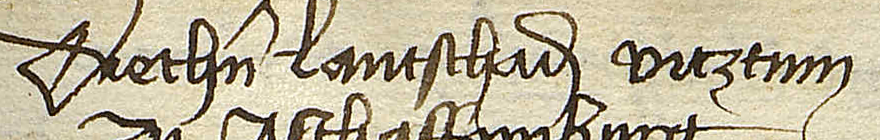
Diethn* lantſchad* vicʒtum
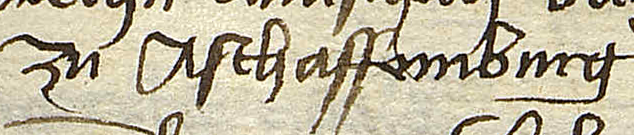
ʒu Aſchaffemburg
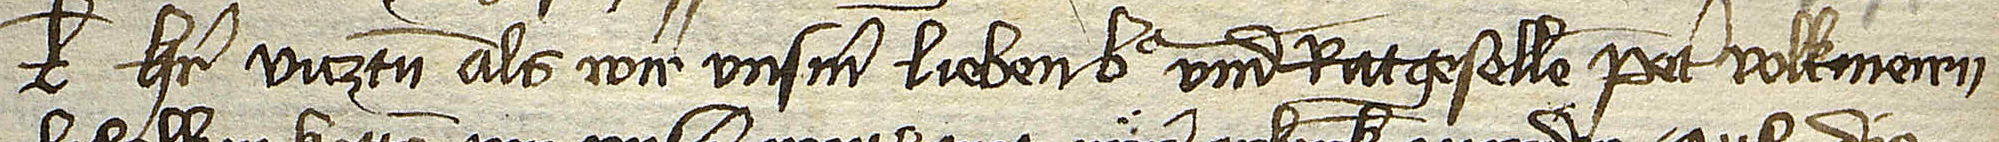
L* hr* vicʒtu* als wir vnſm* lieben b* vnd Ratgeſelle* Pet* volkmeirn
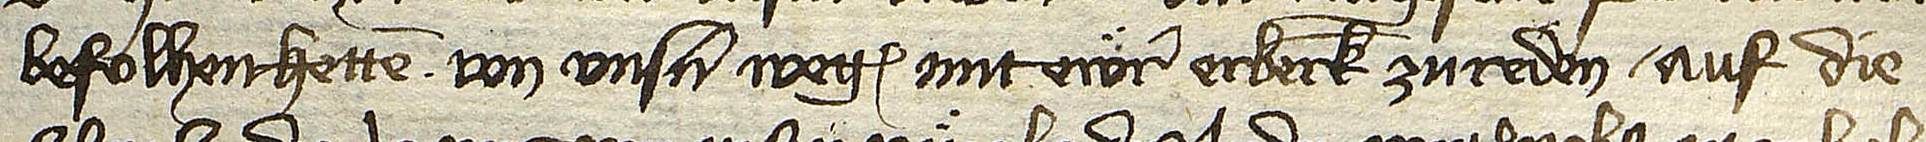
befolhen hette* . von vnſn* weg* mit eẅr* erberk* ʒu reden / auf die
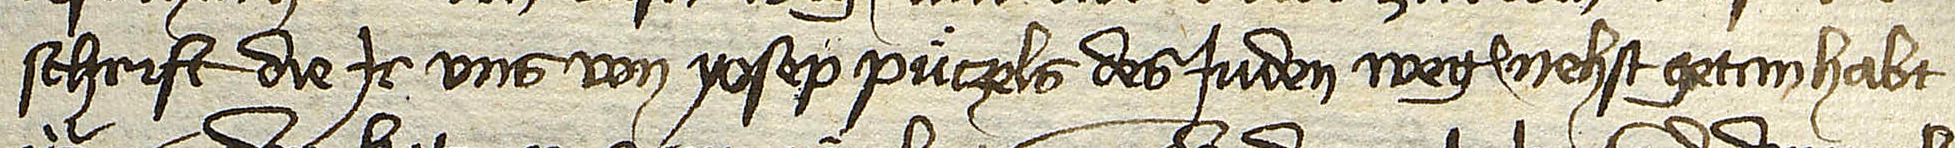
ſchrift die Ir vns von yoſep Pücʒels des Iuden weg* nehſt getan habt
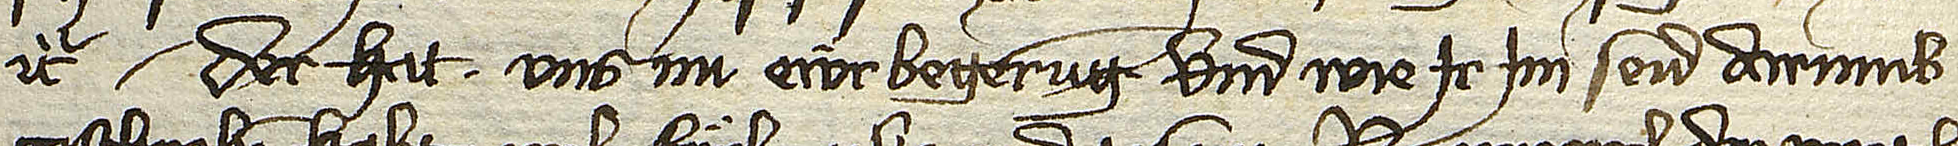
ec* / Der hat . vns nu eẅr begerug* / Vnd wie Ir im ſeid darumb
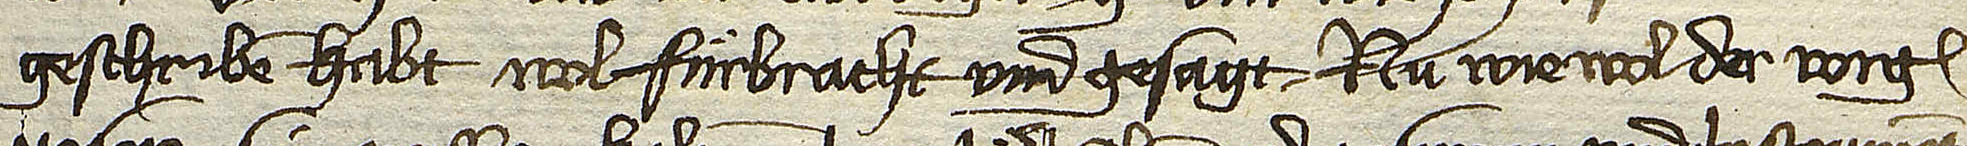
geſchribe* habt wol fürbracht vnd geſagt / Nu wie wol der vorg*
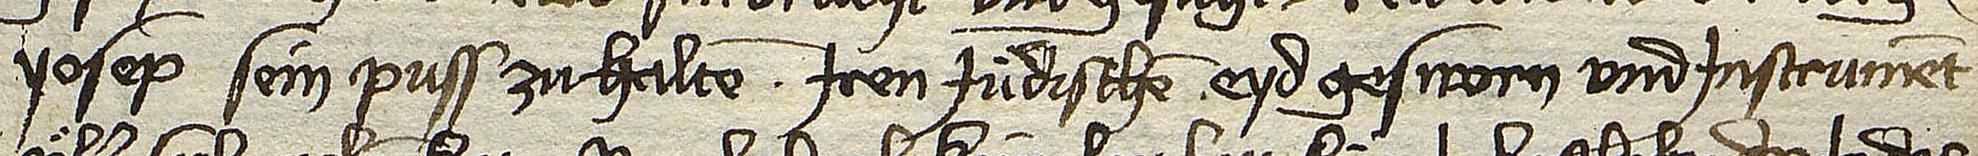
yoſep ſein puſſ ʒu halte* . Iren Iüdiſche* eyd geſworn vnd Inſtrumet*
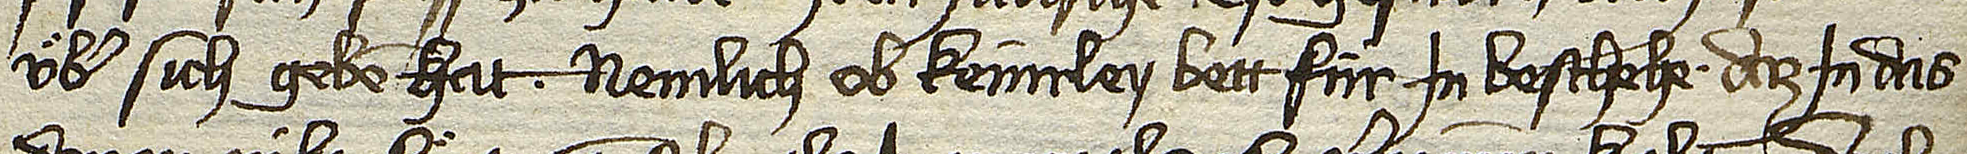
v̈b* ſich gebe* hat . Nemlich ob keinrley bett für In beſchehe . daʒ In das
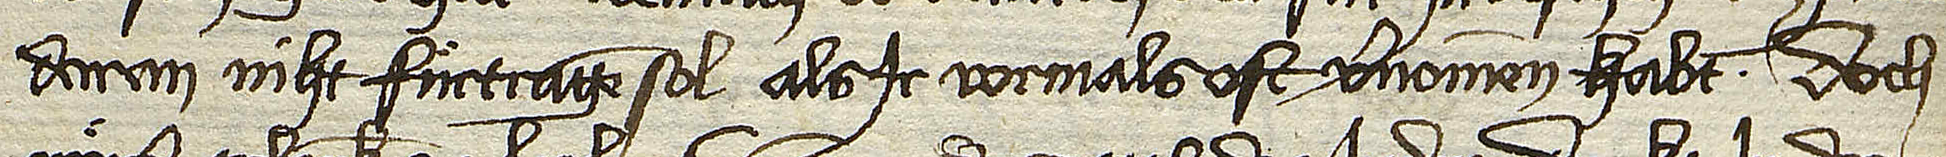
daran niht fürtrage* ſol als Ir vormals oft vnomen* habt . Doch
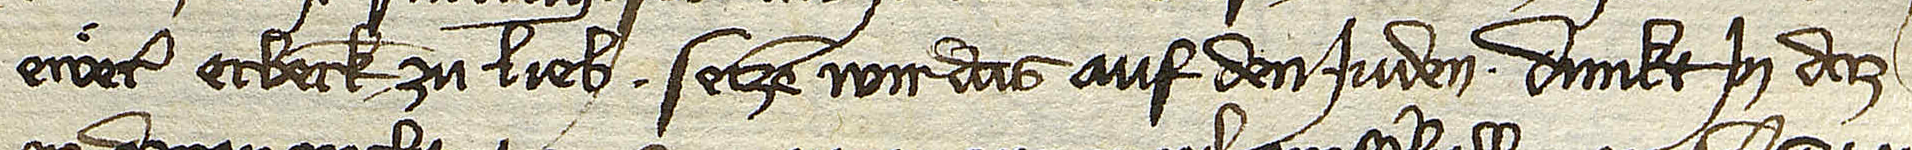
ewer* erberk* ʒu lieb . ſecʒe* wir das auf den Iuden . Dunkt In daʒ
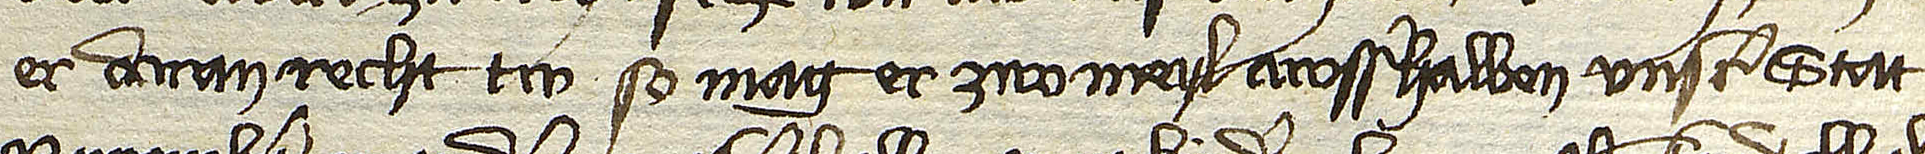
er daran recht tw ſo mag er ʒwo meyl awſſ*halben vnſr* Stat
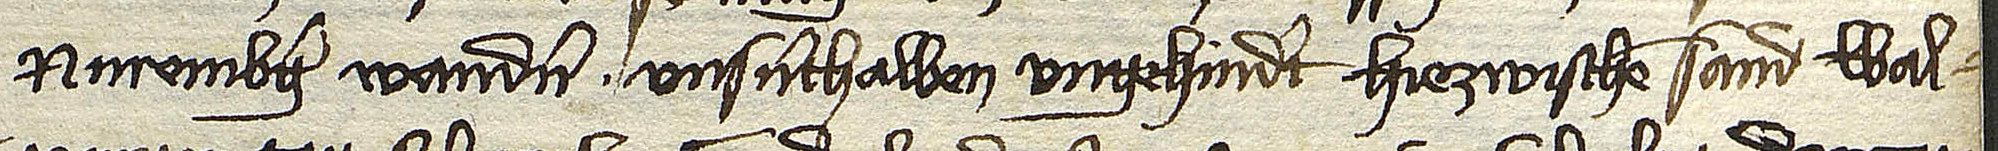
Nurembg* wandn* . vnſnthalben* vngehindt* hieʒwiſche* ſand Wal =
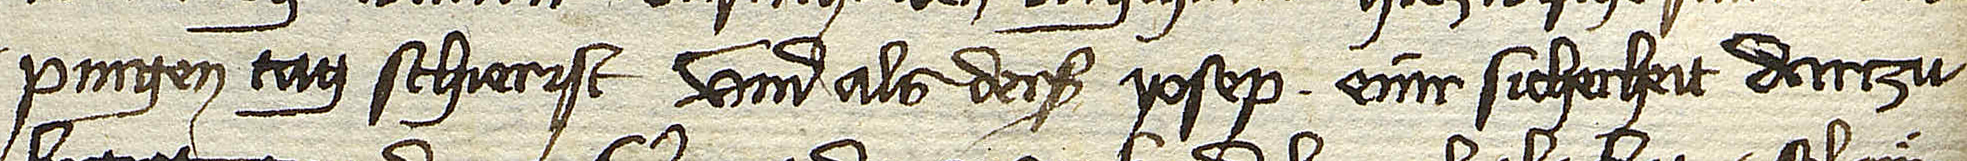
purgen tag ſchieriſt Vnd als derſ* yoſep . ewr ſicherheit darcʒu
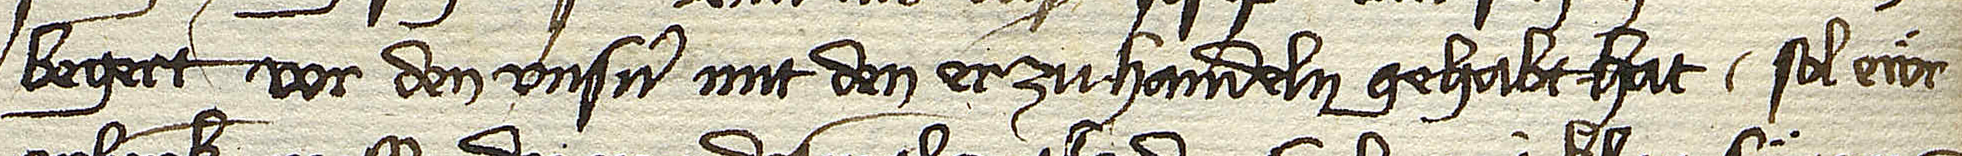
begert vor den vnſn* mit den er ʒu handeln gehabt hat / ſol ewr
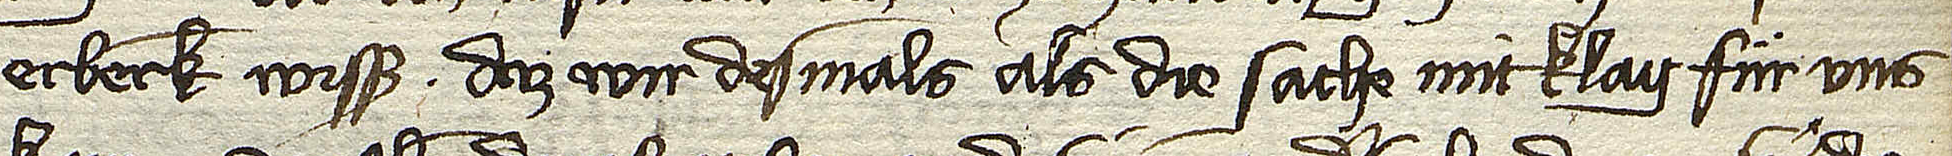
erberk* wiſſ* . daʒ wir deſmals als die ſache mit klag für vns
